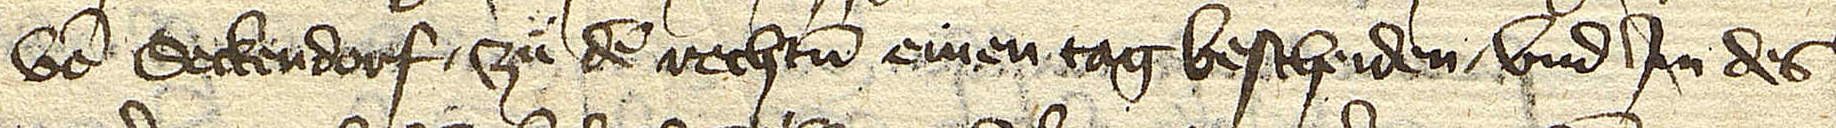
vo* Seckendorf / cʒü de* rechtn* einen tag beſcheiden / vnd Im des
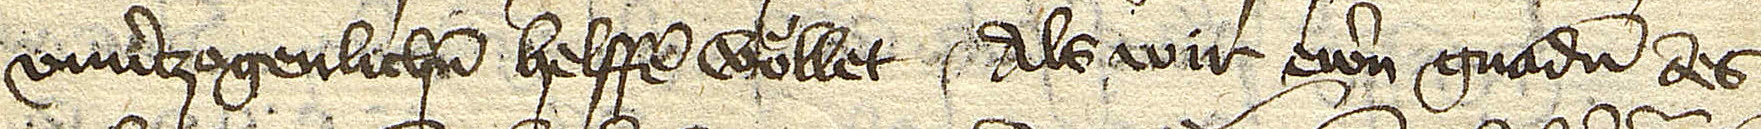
vnu*cʒogenlichn* helffe* wöllet / Als wir ewn* gnadn* des
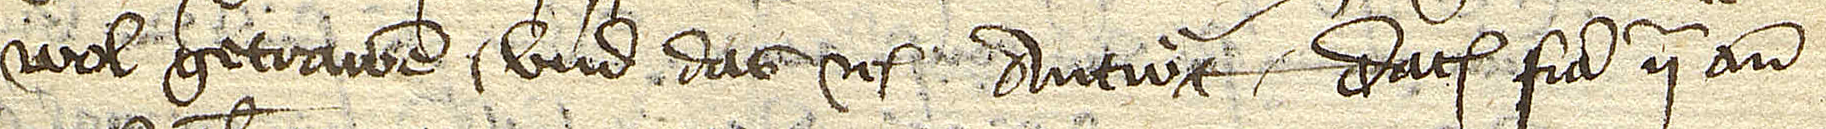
wol getrawe* / vnd das ec* Antw*t / Dat* fia* ii* an*
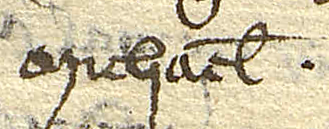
Michael* .
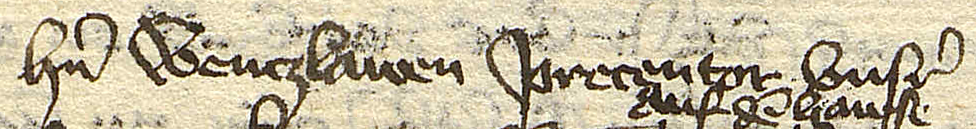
hn* Wencʒlawen Precentor vnſr*
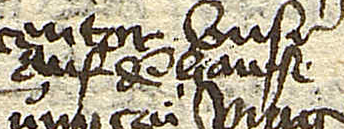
Auf d* hawſe
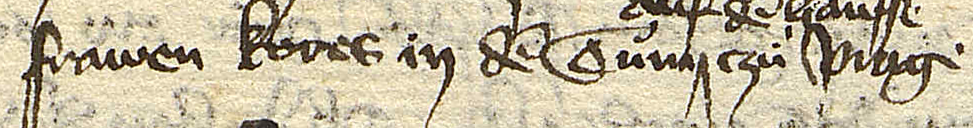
frawen kores in de* Tüm cʒü Prage
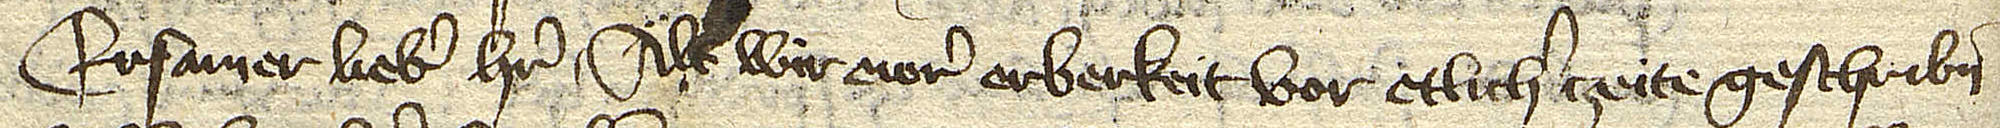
Erſamer lieb* hr* / Als wir ewr* erberkeit vor etlich* cʒeite geſchribn*
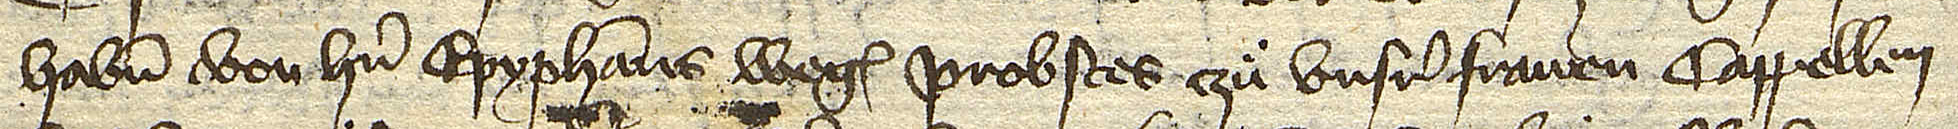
habn* / von hn* Epypha*ns weg* Probſtes cʒü vnſr* frawen Cappellen
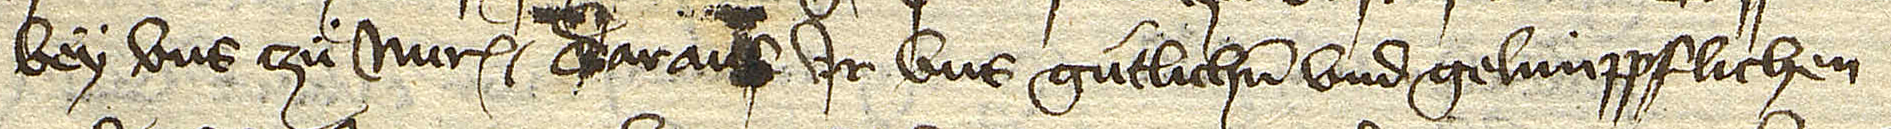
bey vns cʒü Nur* / Darauf Ir vns gütlichn* vnd gelimppflichen
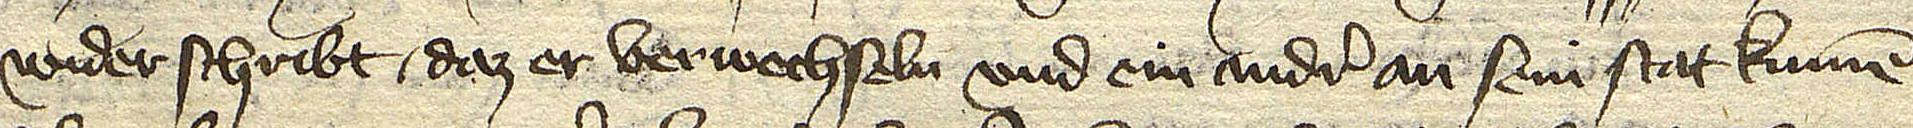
wider ſchribt / daʒ er verwechſeln vnd ein andr* an ſein ſtat kume*
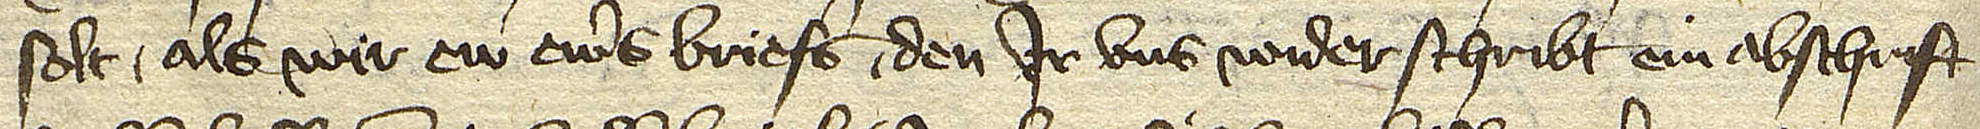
ſolt / als wir ew ew*s briefs / den Ir vns wider ſchribt ein abſchrift
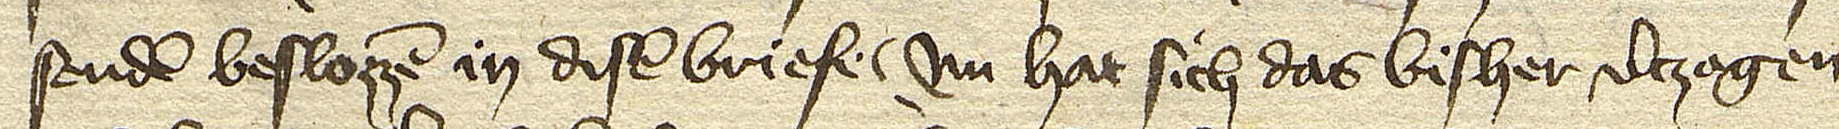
ſende* beſloʒʒe* in diſe* briefe / Nu hat ſich das biſher v*cʒogen
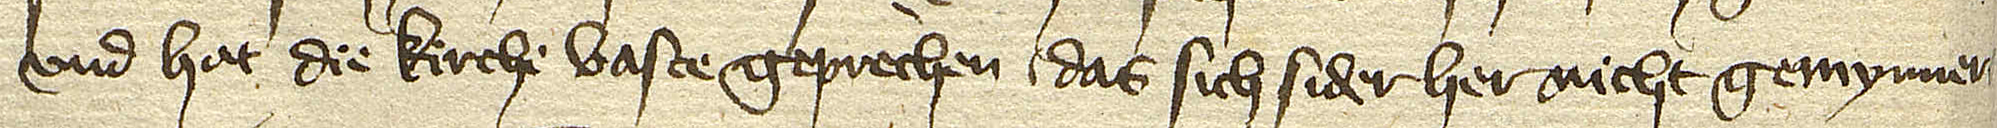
vnd hat die kirche vaſte geprechen / das ſich ſider her nicht gemynnet
